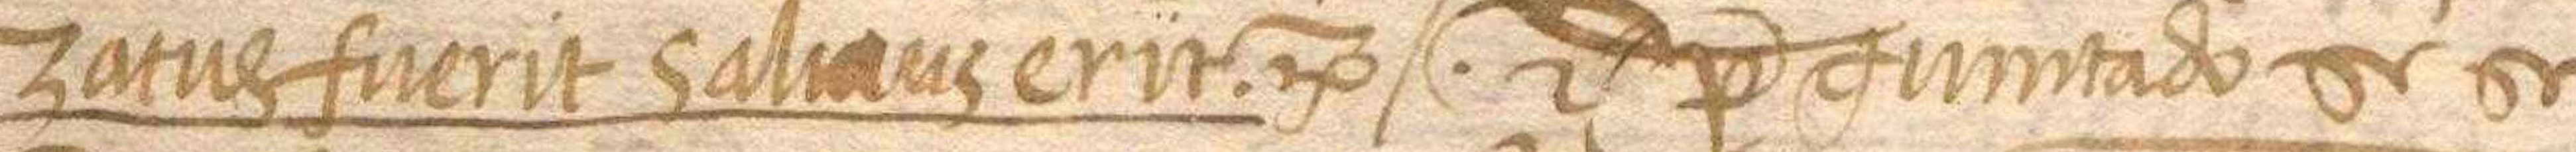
zatus fuerit saluus erit. c̄ꝭ /. item p̄gumtado se se
